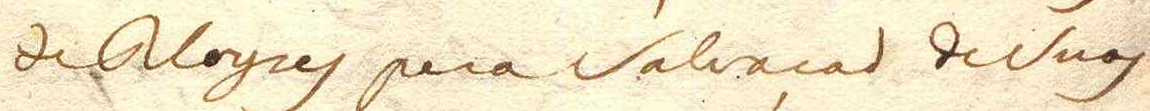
de Moyzes pera salvaçaõ de suas
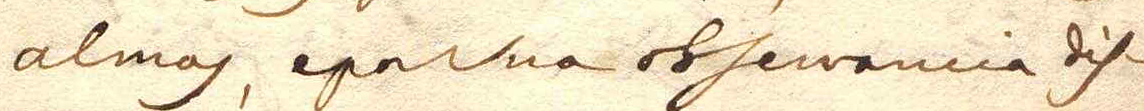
almas, e por sua observancia dis
